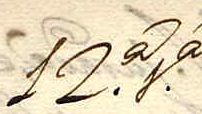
12.a t.a
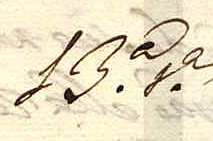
13.a t.a
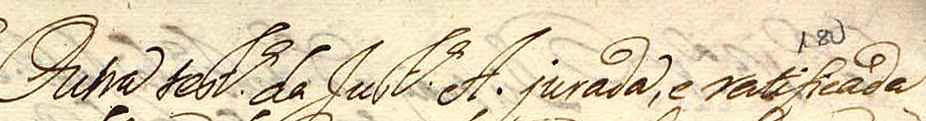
Outra test.a da Just.a A. jurada, e ratificada
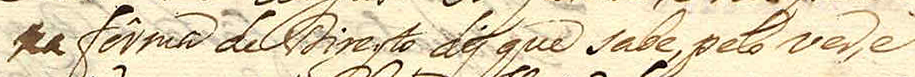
na forma de Direyto dis que sabe, pelo ver, e
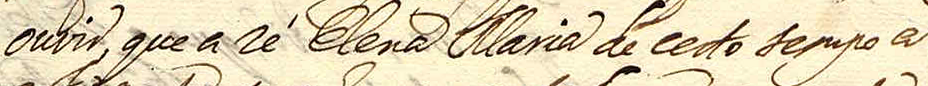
ouvir que a Ré Elena Maria de certo tempo a
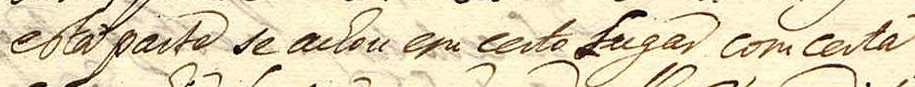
esta parte se achou em certo Lugar com certa
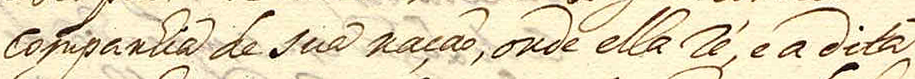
companhia de sua naçaõ, onde ella Ré, e a dita
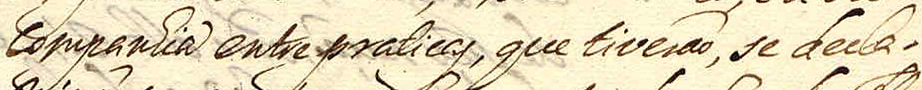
companhia entre praticas, que tiveraõ, se decla
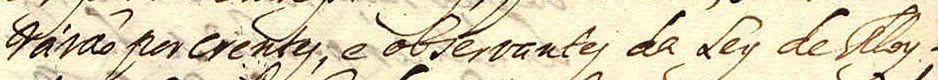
ráraõ por crentes, e observantes da Ley de Moy
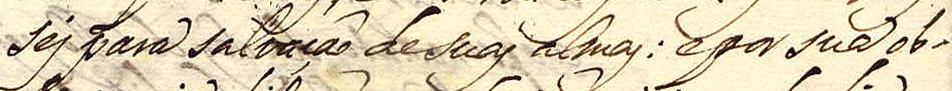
sés para salvaçaõ de suas almas: e por sua ob
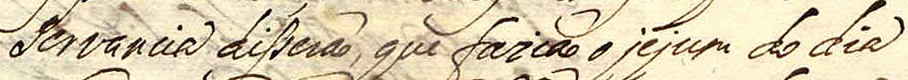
servancia disseraõ, que faziaõ o jejum do dia
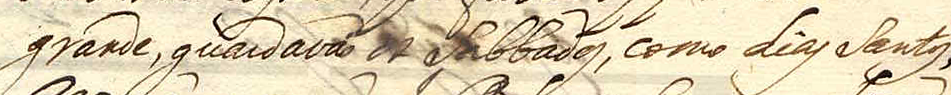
grande, guardavaõ os Sabbados como dias Santos,
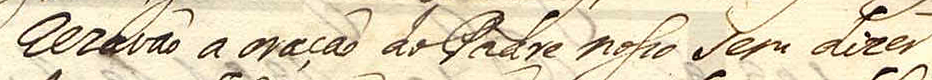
Rezavaõ a oração do Padre nosso sem dizer
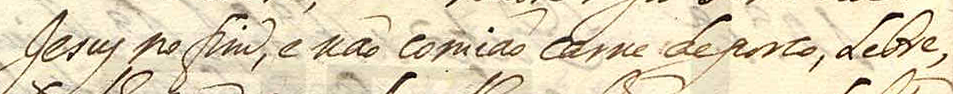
Jesus no fim, e não comiaõ carne de porco, Lebre,
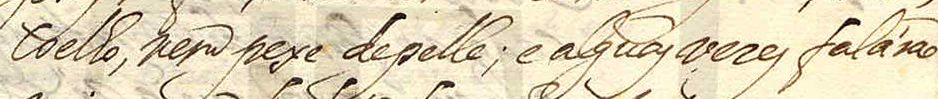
coelho, nem pexe de pelle; e algūas vezes faláraõ
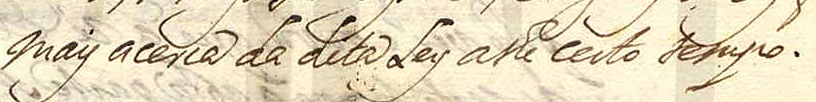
quais açerca da dita Ley athé certo tempo.
